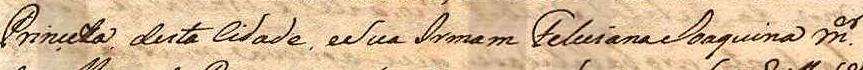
Princeza desta Cidade, e Sua Irmam Feleciana Ioaquina m.er
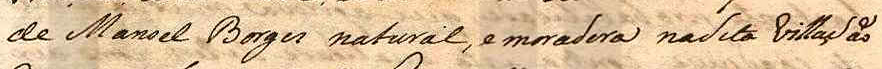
de Manoel Borges natural, e moradora na dita Villa São
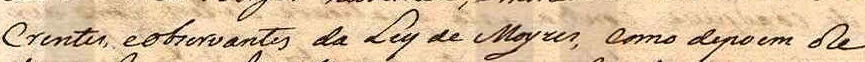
crentes, e observantes da Ley de Moyzes, como depoem o Re
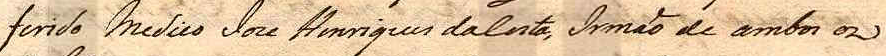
ferido medico Ioze Henriques da Costa, Irmaõ de ambos oz
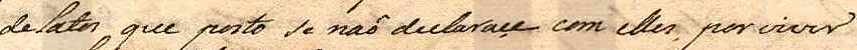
delatos que posto se naõ declarace com elles, por viver
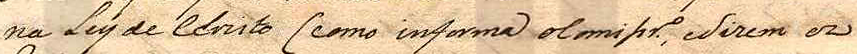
na Ley de Christo (como informa o Comissr.o, e dizem oz
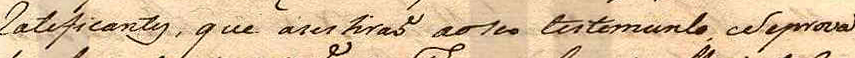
Ratificantes, que asestiraõ ao seo testemunho, e se prova
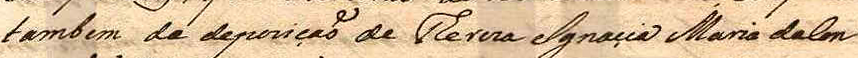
tambem da depoziçaõ de Thereza Ignacia Maria da Con
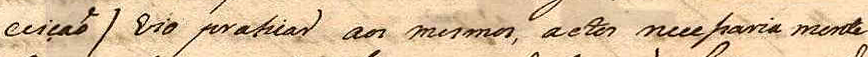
ceiçaõ / vio praticar aos mesmos, actos necessariamente
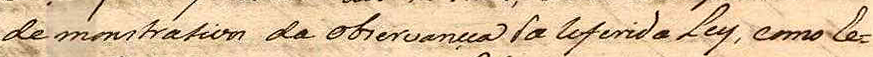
demonstrativos da observançia da Referida Ley, como he
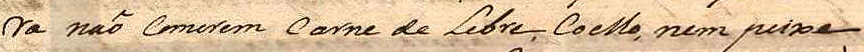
ra naõ comerem carne de Lebre, Coelho, nem peixe
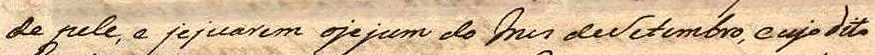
de pele, e jejuarem o jejum do mes de Setembro, cujo dito
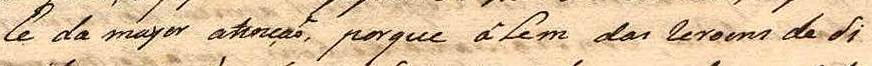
he da mayor atençaõ, porque áLem das Rezoens de di
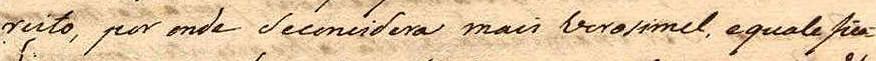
reito, por onde se concidera mais verosimel, e qualefica
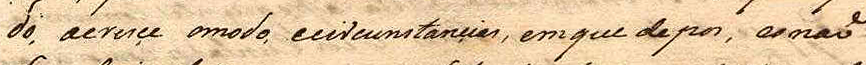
do, acresce o modo, e circunstancias, em que depos, e o naõ
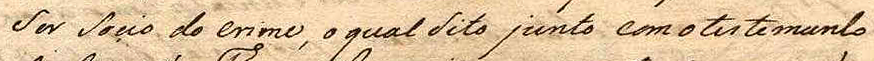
ser socio do crime, o qual dito junto com o testemunho
